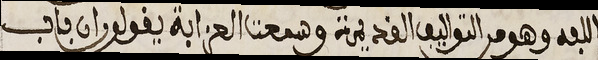اللفه وهو من التواليف القديمة وسمعت العزابة يقولون ان باب
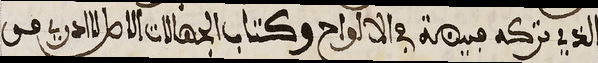الذي تركه مبيضة في الالواح وكتاب الجهالات الاصل لا ادري من
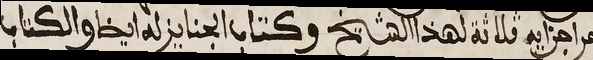من اجزايه ثلاثة لهذا الشيخ وكتاب الجنايز له ايضا والكتاب
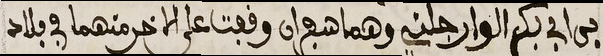بن ابي بكر الوارجلني وهما سفران وقفت على الاخر منهما في بلاد
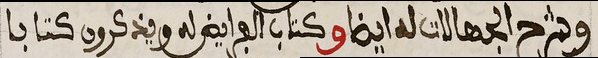وشرح الجهالات له ايضا وكتاب الفرايض له ويذكرون كتابا
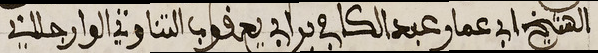الشيخ ابي عمار عبد الكافي بن ابي يعقوب التناوتي الوارجلاني
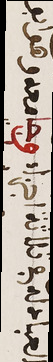العباد في ثلاثة اجزاء وجامعه وهو ابو
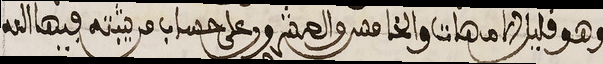وهو قليل الامهات والخامس والعشرون على حساب من يثبته فيها الله
